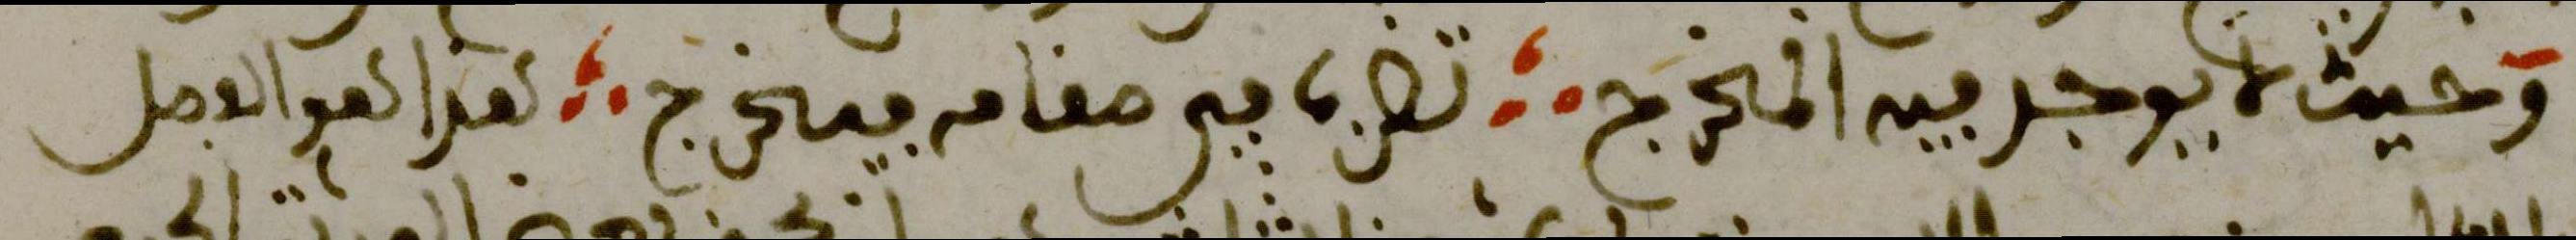وحيث لا يوجد فيه المخرج تضرب في مقامه فيخرج هذا هو الفصل
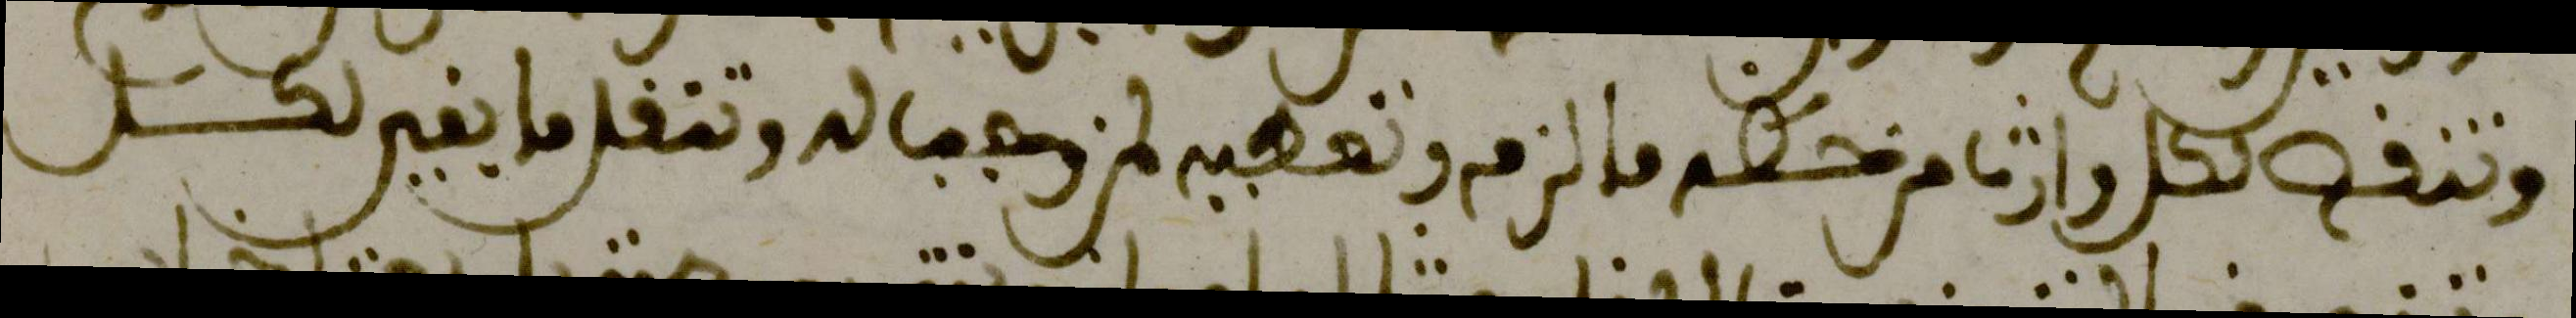وتنقص لكل وارث من حظه ما لزمه تعطيه لمن وجب له وتنقد ما بقي لكل
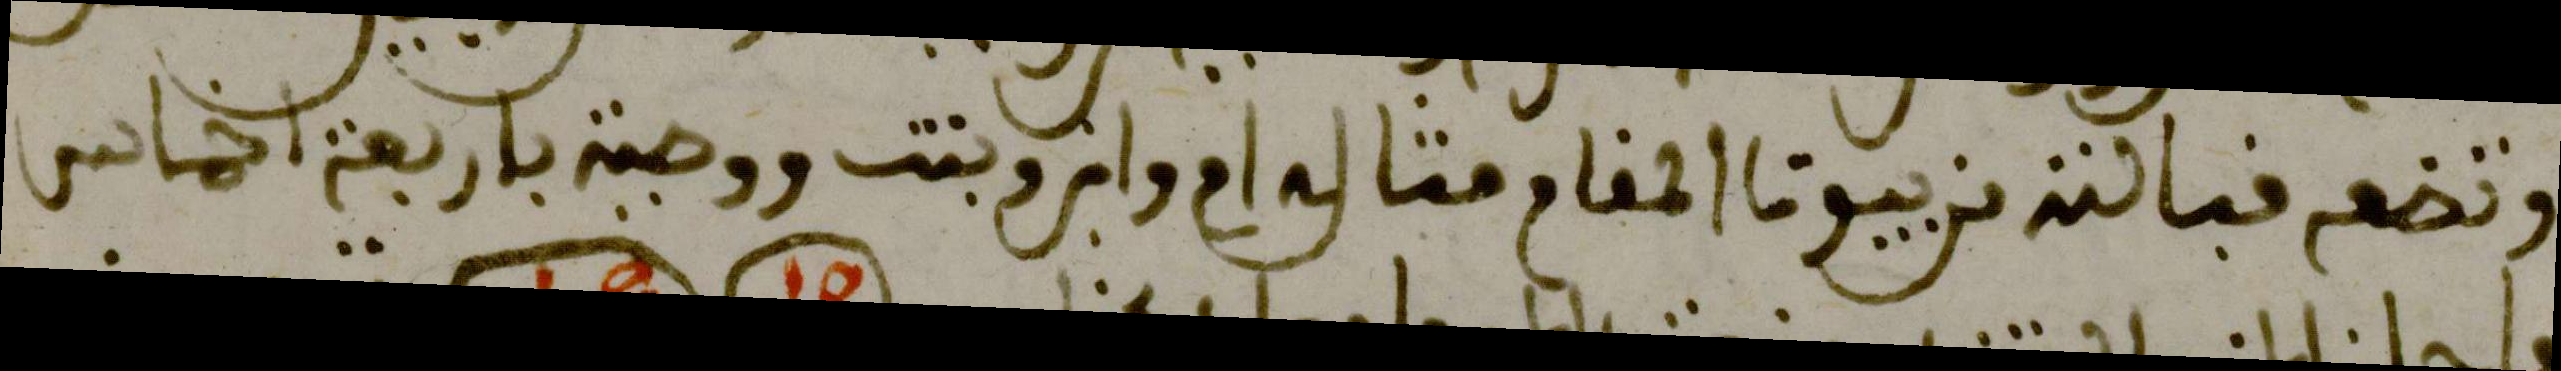وتضعه قبالته من بيوتا المقام مثاله ام وابن وبنت ووصية باربعة اخماس
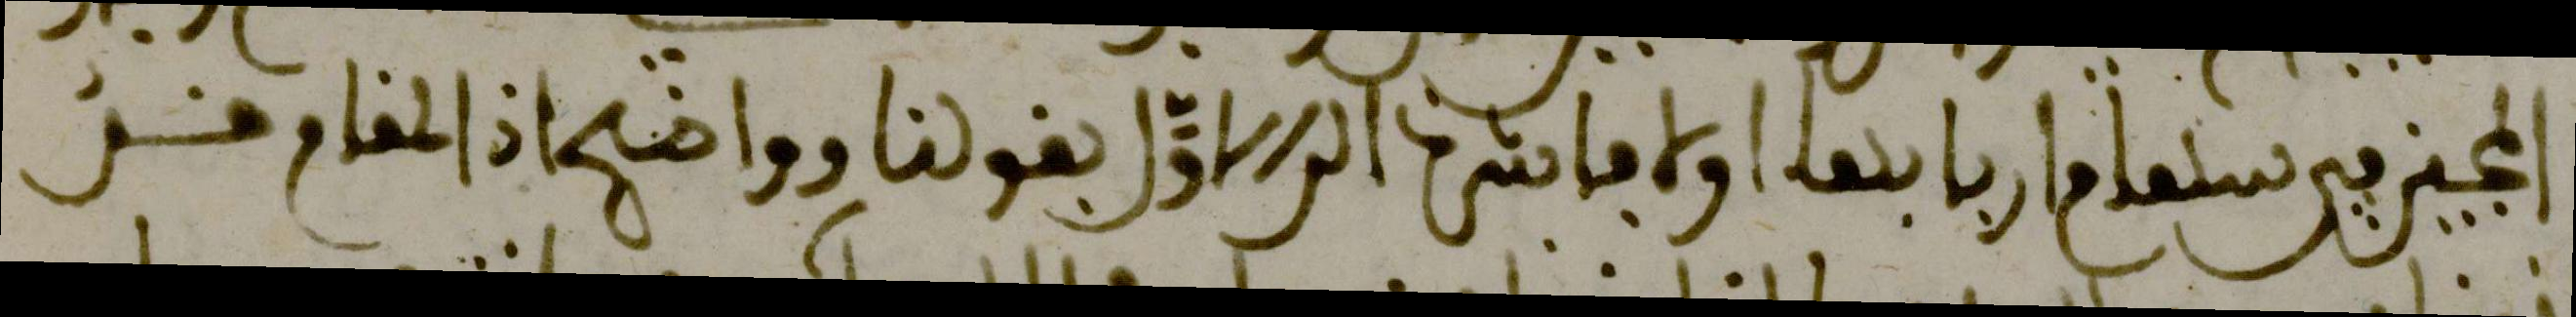المجيز في سهام اربابها او لا باشرنا الى الاوّل بقولنا وواضح اذ المقام قد
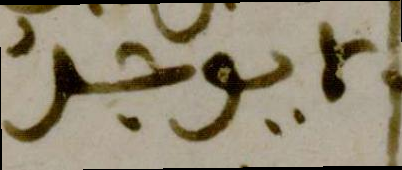لا يوجد
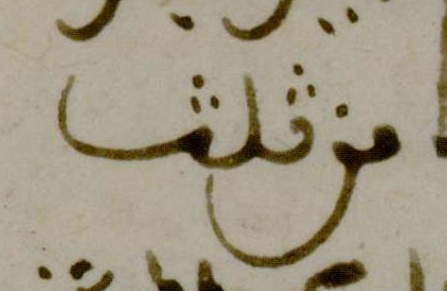من ثلث
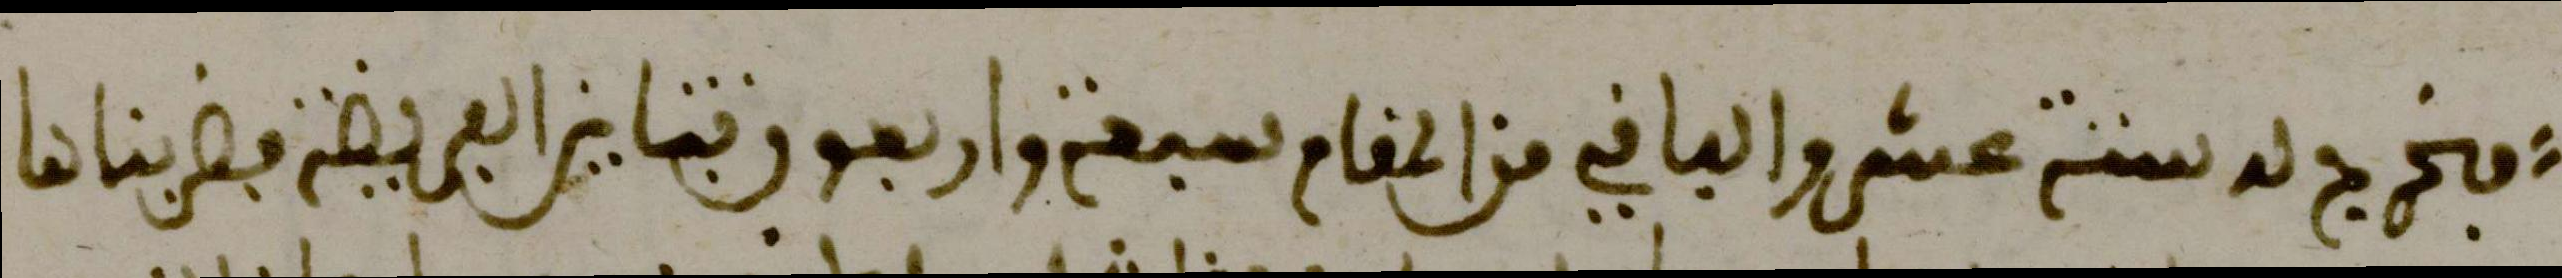فخرج له ستة عشر والياقي من المقام سبعة واربعون تباين الفريضة فضربناها
